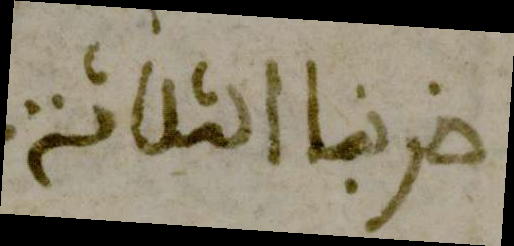ضربنا الثلاثة
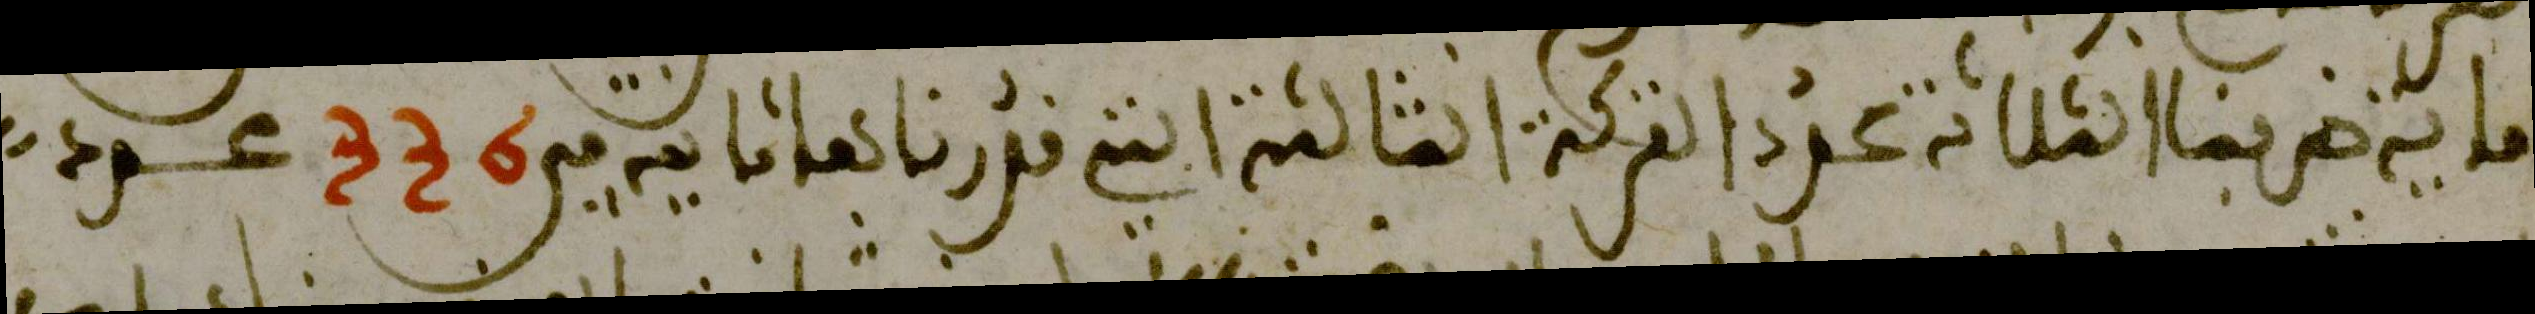ماية ضربنا الثلاثة عدد التركة الثالثة التي قدرناها ثانية في 336 عدد
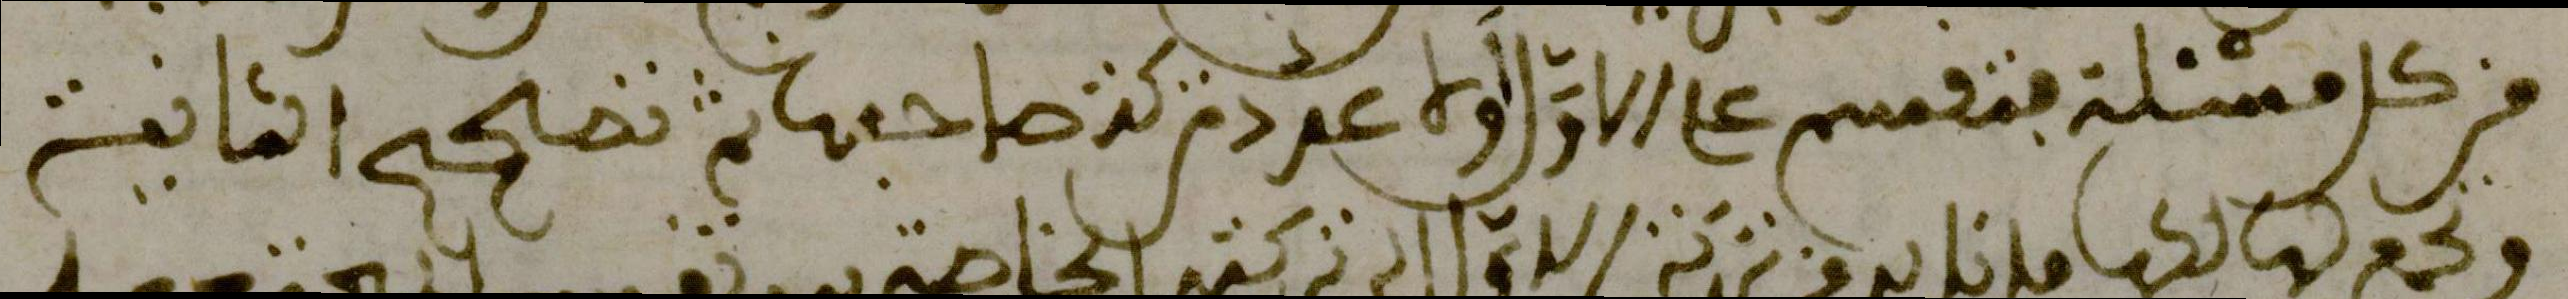من كل مسْئلة فتقسم على الاوّل ولا عدد تركة صابها ثم تصحح الثانية
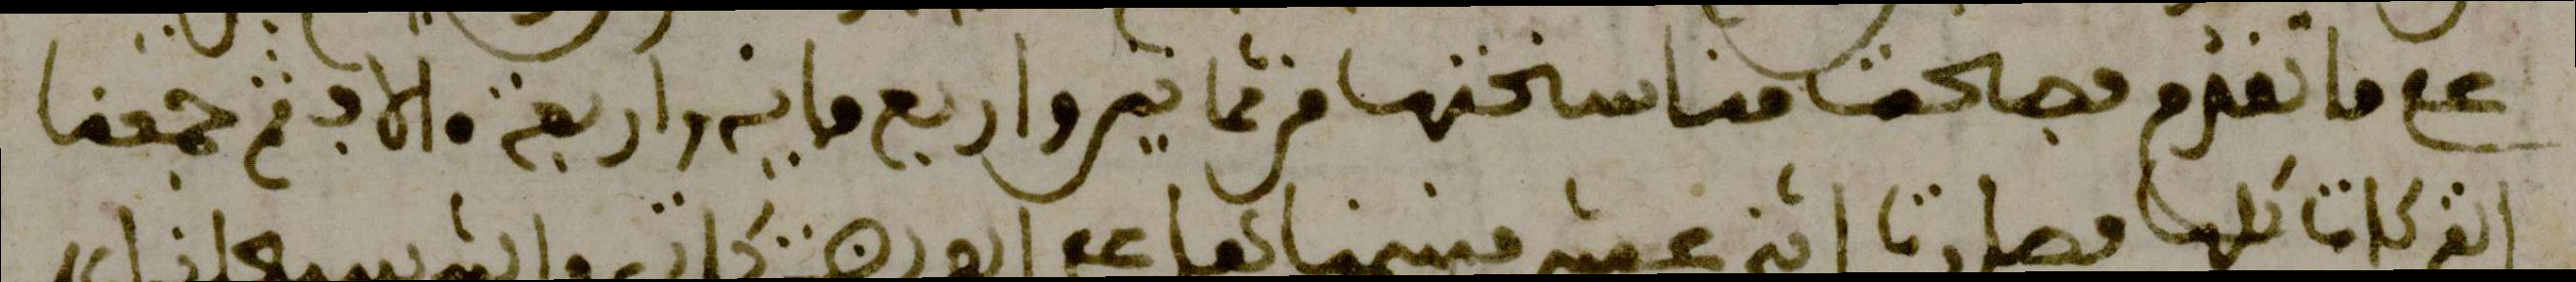على ما تقدم فصحت مناسختها من ثمانين واربع ماية اربعة ءالاف ثم جمعنا
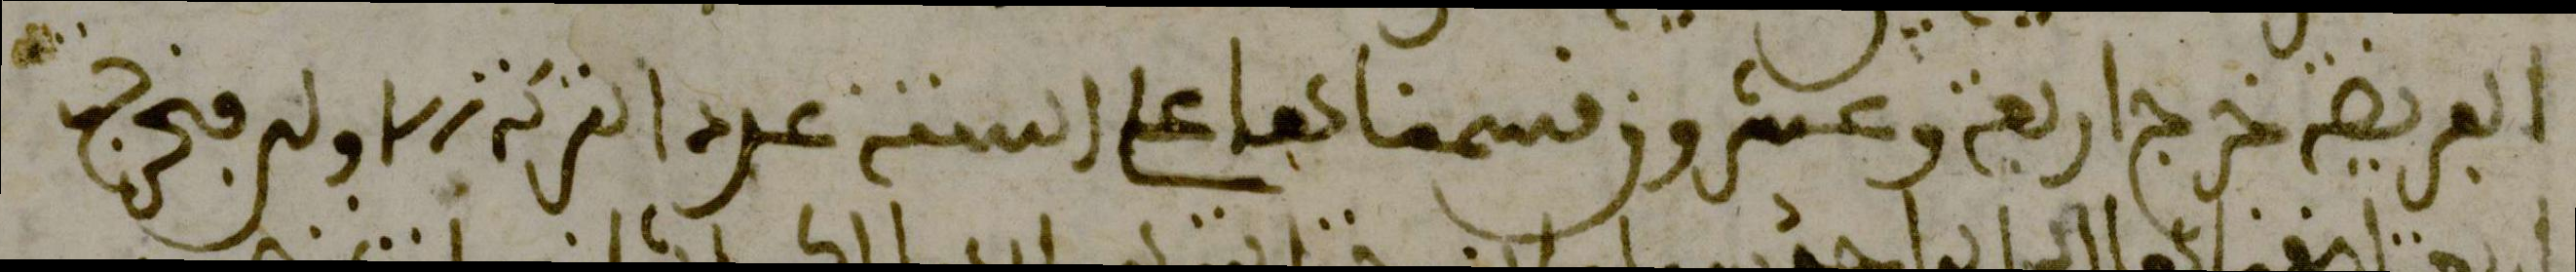الفريضة خرج اربعة وعشرون قسمناها على الستة عدد التركة الاولى فخرجت
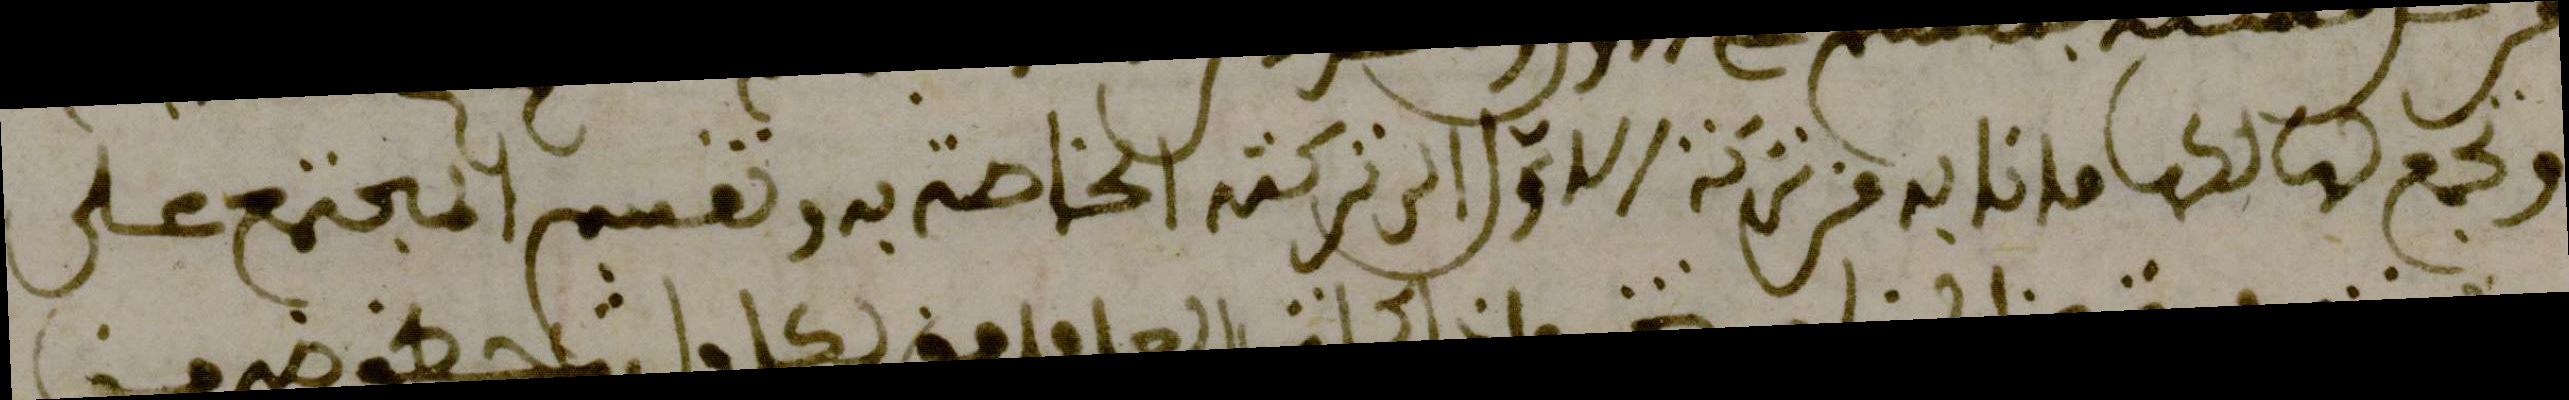وتجمع لهالكها مانا به من تركة الاوّل الى تركته الخاصة به وتقسم المجتمع على
